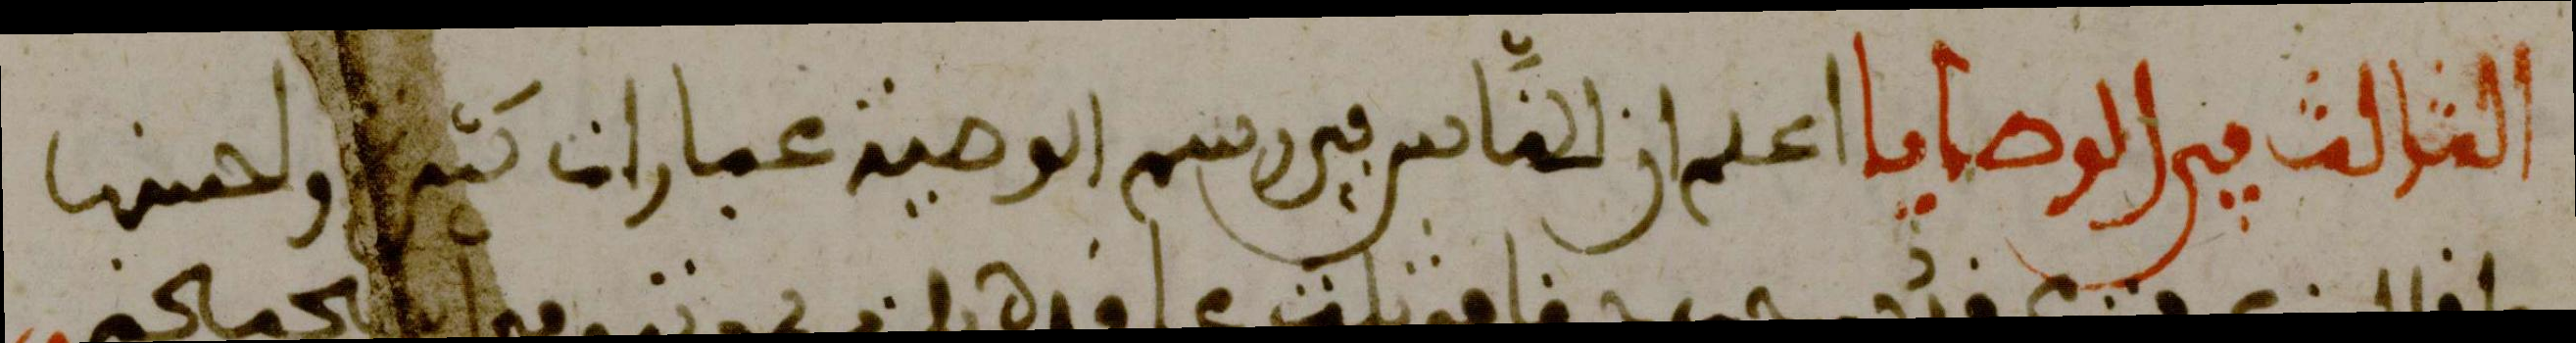الثالث في الوصايا اعلم ان للنّاس في رسم الوصية عبارات كثيرة ولحسنها
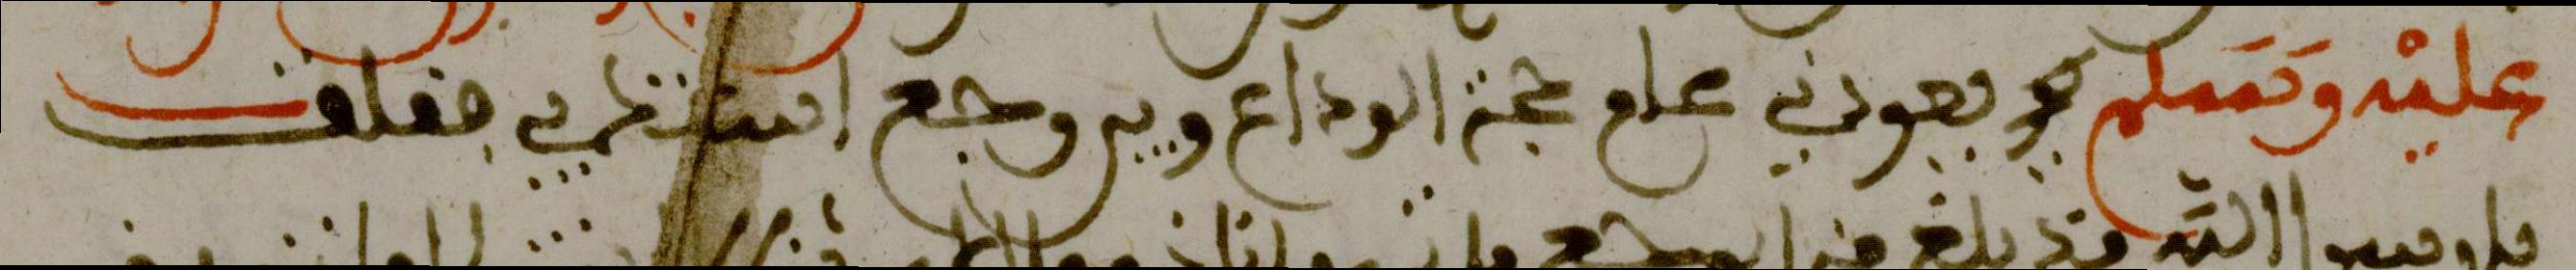عليْه وَسَلم يعودني عام حجة الوداع وبي وجع استدبي فقلت
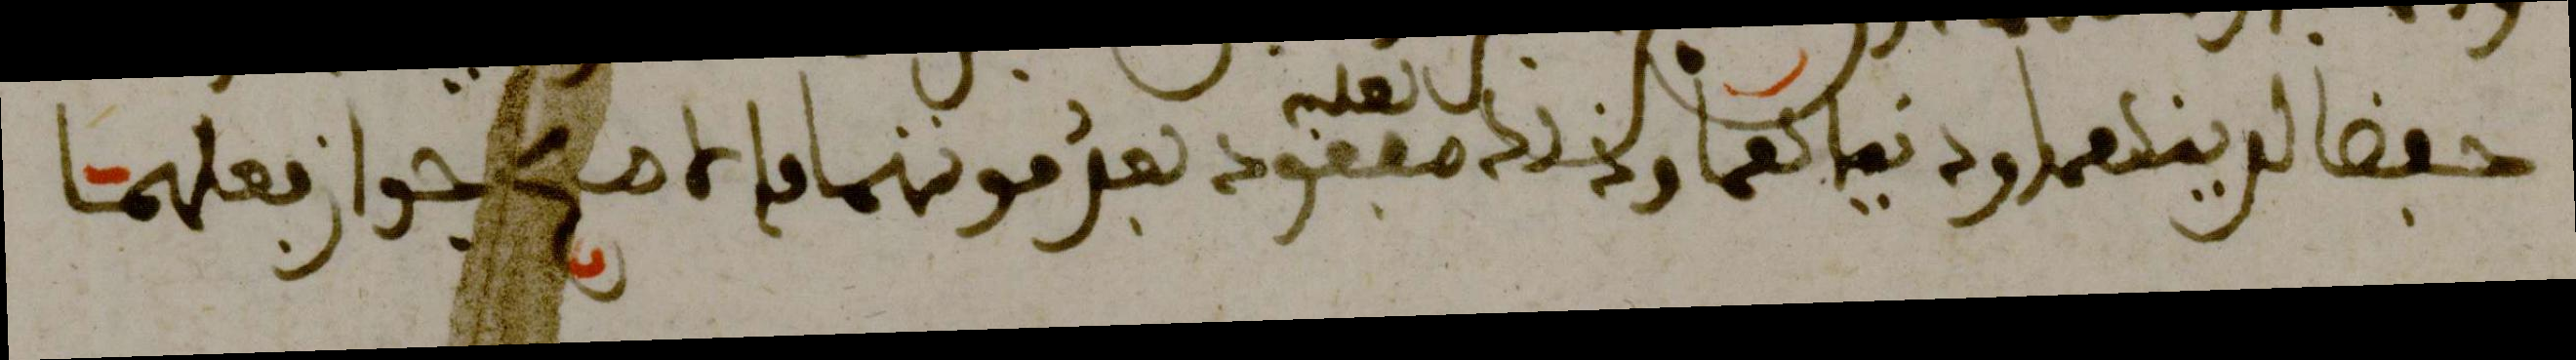جعضا لدينهما ودنيا هما وذلك مفقرد بعد موتهما ما لا صلح جواز فعلهما
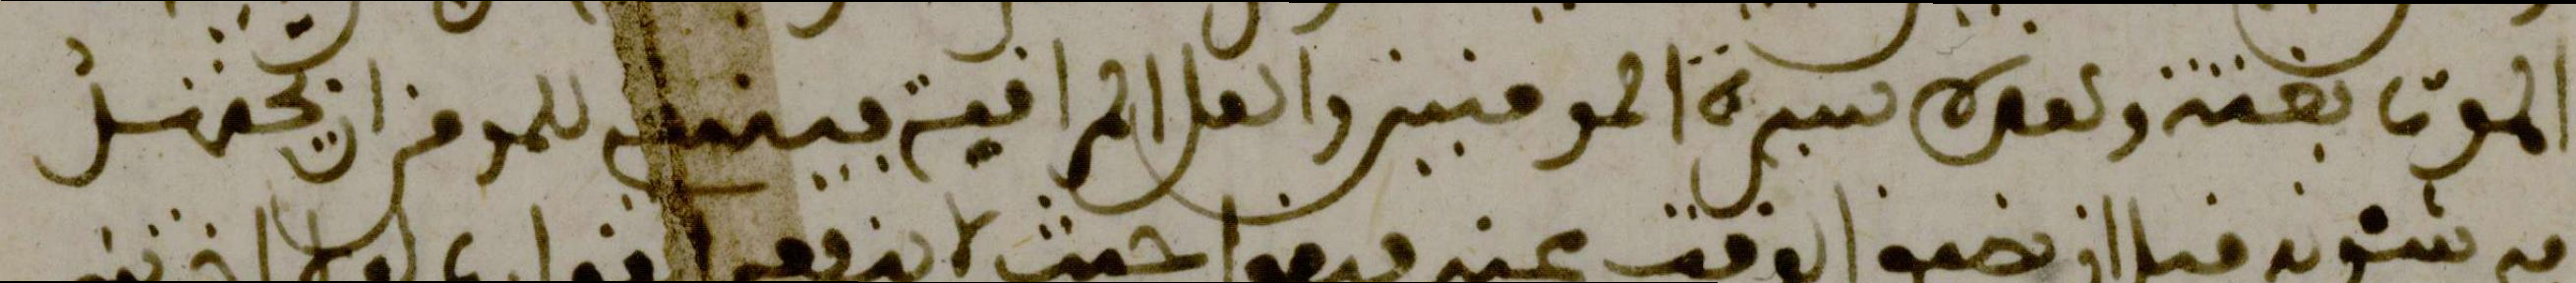الموت بغتة وهذه سيرة المومنين واهل المراقبة فينبغي للمومن ان يجتهد
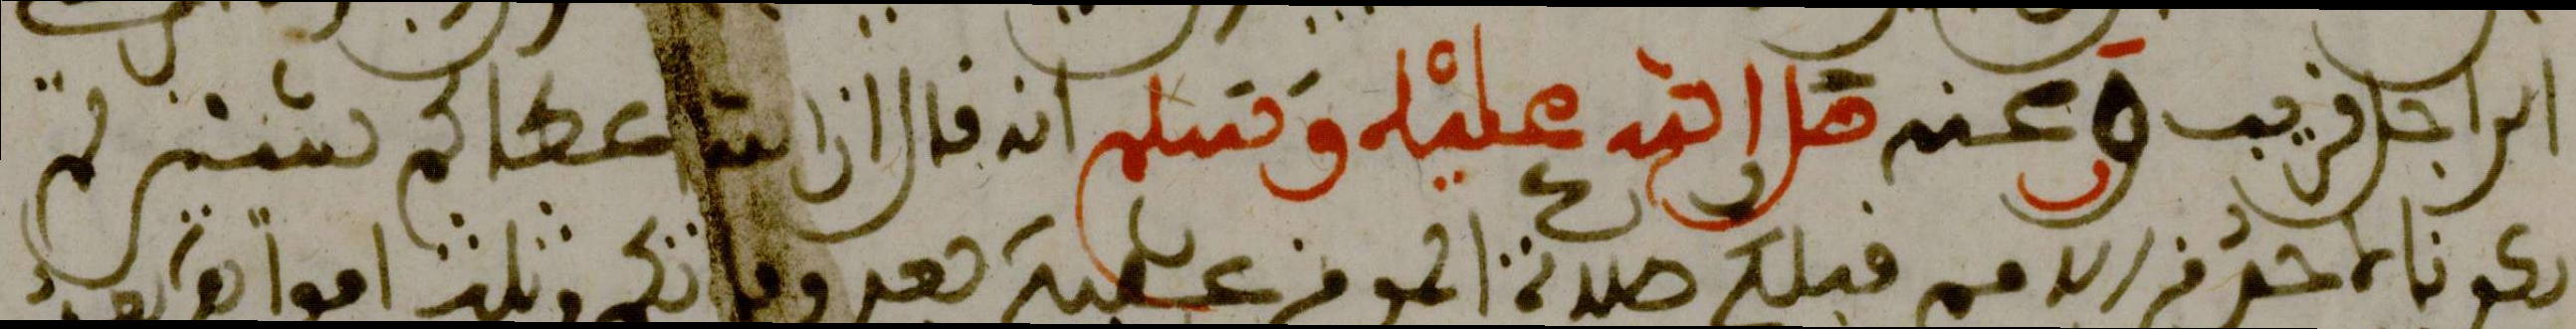الى اجل قريب وَعنه صَل الله عليْه وَسَلم انه قال ان الله عطاكم شيئين لم
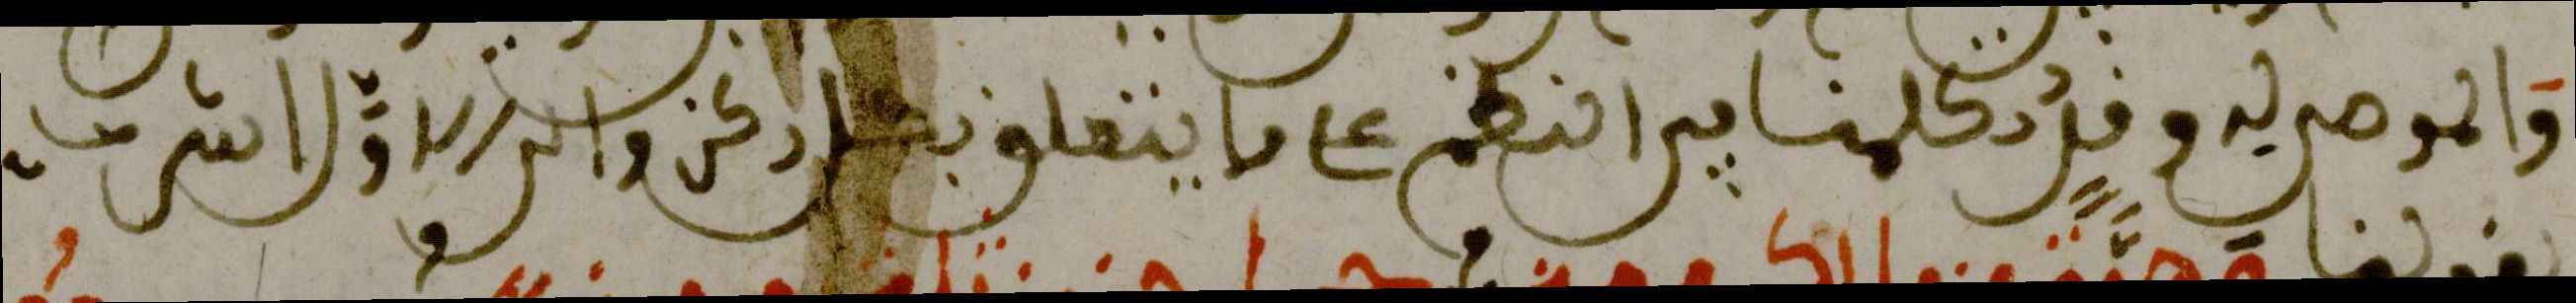وَالموصى به وقد تكلمنا في النظم على ما يتعلق بطل ركن والى الاوّل اشرنا
